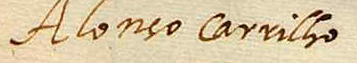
Alonço Carrilho
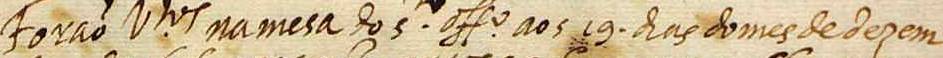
Foraõ V.tos na mesa do sto. off.o aos 19. dias do mes de dezem
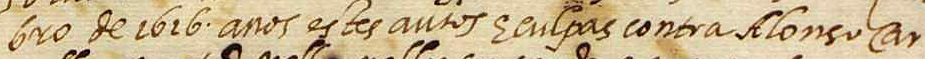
bro de 1616. anos estes autos E culpas contra Alonso Car
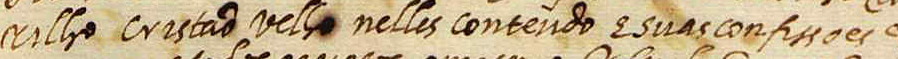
rilho cristão velho nelles conteudo E suas confissoes E
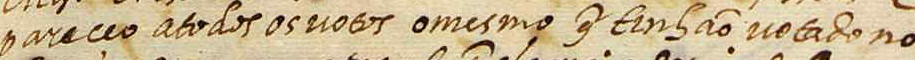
pareceo a todos os uotos o mesmo q̄ tinhaõ uotado no
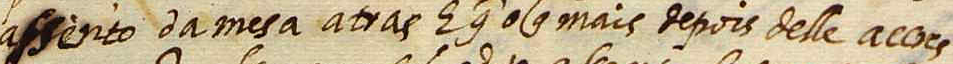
assento da mesa atras E q̄ o q̄ mais depois delle acres
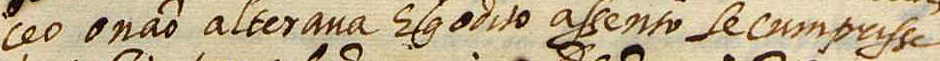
ceo o naõ alteraua E q̄ o dito assento se cumprisse
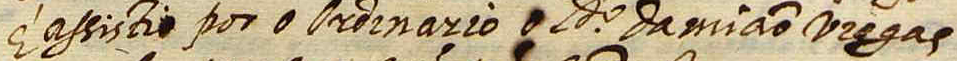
E assistio por o Ordinario o L.do damião viegas
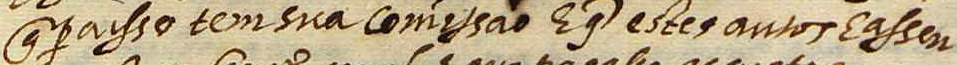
q̄ ꝑa isso tem sua com̄issão E q̄ estes autos E assen
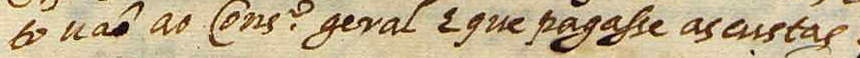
to uão ao Cons.o geral E que pagasse as custas
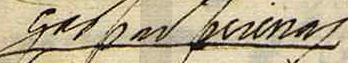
Gaspar pereira
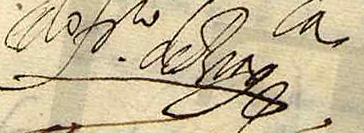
dō fr.co de Bragça
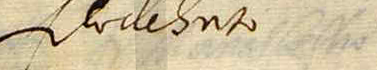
frco de brito
